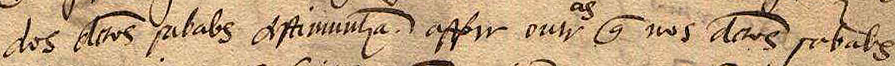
dos d̄ctos sabados testimunhā affora outras q̄ nos d̄ctos sabados
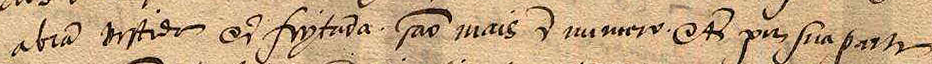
a viā vestida e ēfeytada são mais ē numero e tē por sua parte
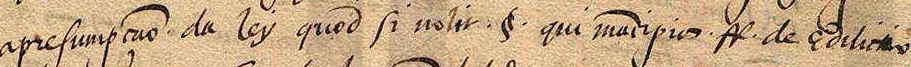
a presumpção da ley quod si nolit .§. qui m̄acipia .ff. de Edilicto
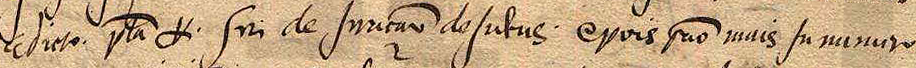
Edicto p̄la R. ser de Jeração de Judeus e pois são mais Jn numero
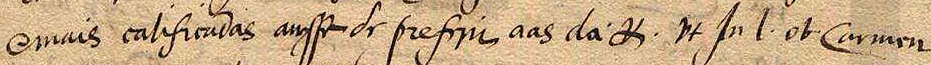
e mais calificadas amsse de preferir aas da .R. vt Jn l. ob Carmen
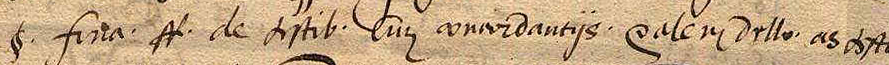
.§. fina. ff. de testib. Cum concordantijs e alem dello as testi
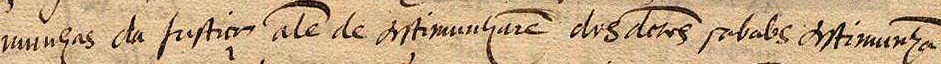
munhas da Justiça āle de testimunhāre dos d̄ctos sabados testimunhā
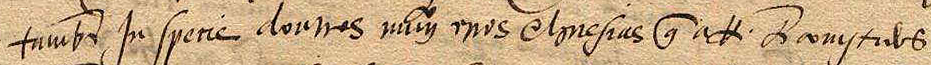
tambē Jn Specie doutros muyto erros e heresias q̄ a R. tē comjtidos
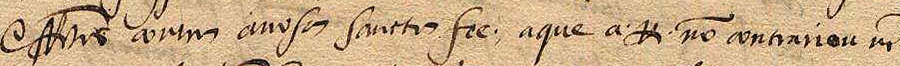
e ff̄ctos contra a nosa Sancta fee a que a .R. nõ contrariou nē
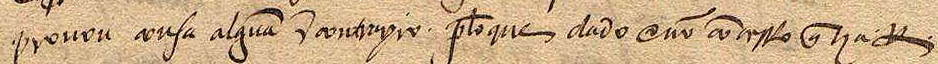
prouou cousa algūa ē contrayro p̄lo que dado e nō c̄osesso q̄ ha R.
